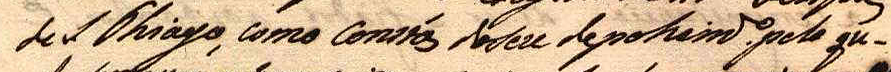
de S Thiago, como consta do seu depohim.to pelo qu
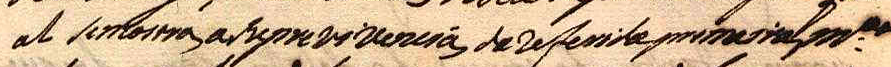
al se mostra a suprevivencia da Referida primeira m.er
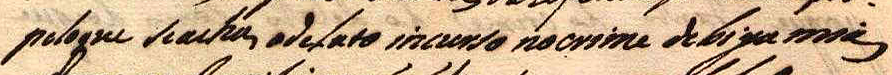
pelo que se acha o delato incurso no crime de bigamia
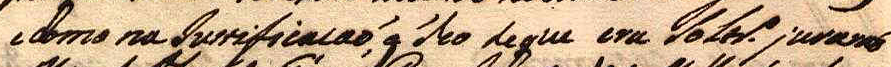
e como na Iustificaçaõ, q̄ deo de que era soltr.o juram
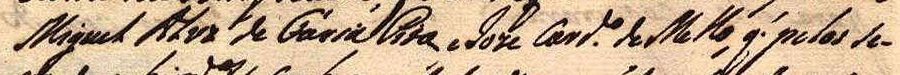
Miguel Alvz̄ de Faria Pita, e Ioze Card.o de Mello, q̄ pelos se
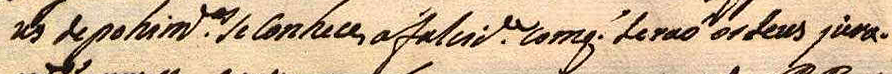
us depohim.tos se conhece a falcid.e com q̄ deraõ os seus jura
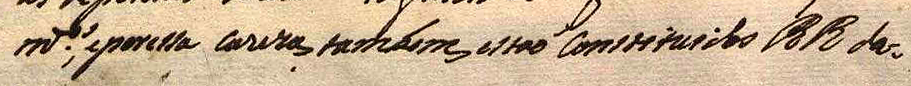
m.tos, e por essa cauza tambem estaõ constituidos RR da
